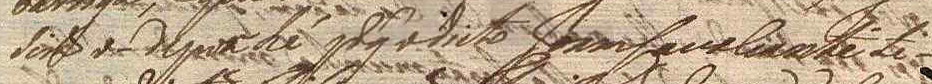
sinā o depoēte pl q̄ o dicto Joam Cavalcante ti
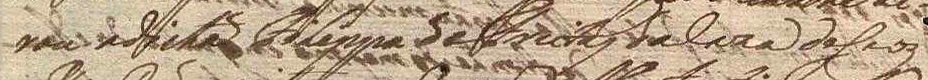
rou a dicta Felippa de Freitas da Caza de seoz
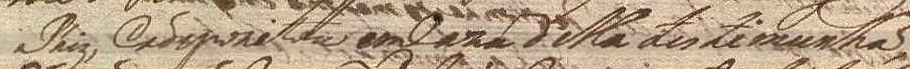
Páiz, E a depozitou em Caza della testimunha,
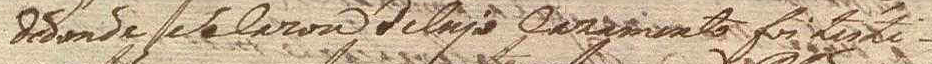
de donde Se Cazou de Cujo Cazamento foi testi
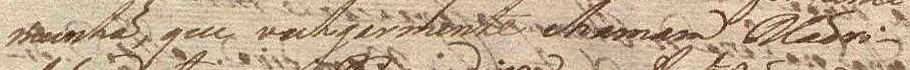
munha, que vulgarmente chamam Madri
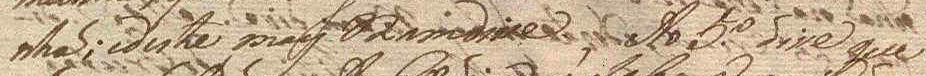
nha; e deste mais Nam disse, Ao 5.o disse que
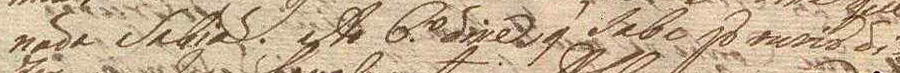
nada Sabia. Ao 6.o disse q̄ sabe p̄ ouvir di
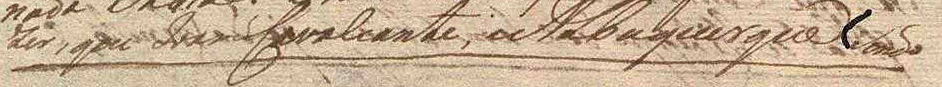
zer, que Ioam Cavalcante, e Albuquerque sendo
